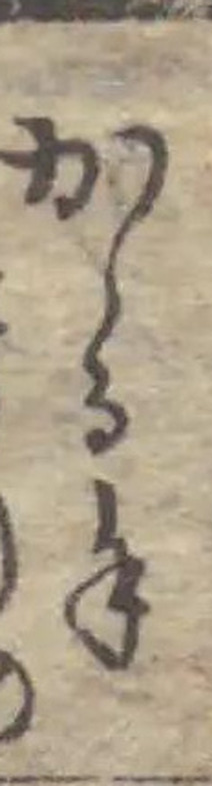かゝる手
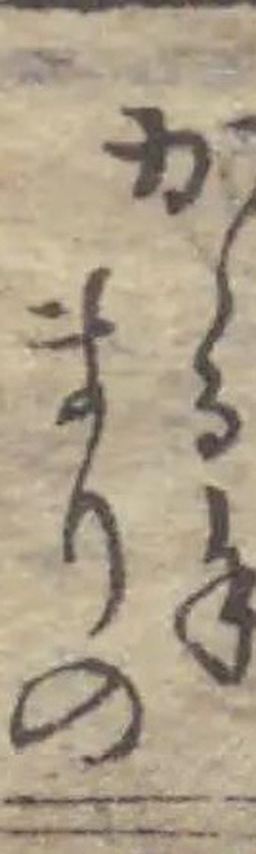まりの
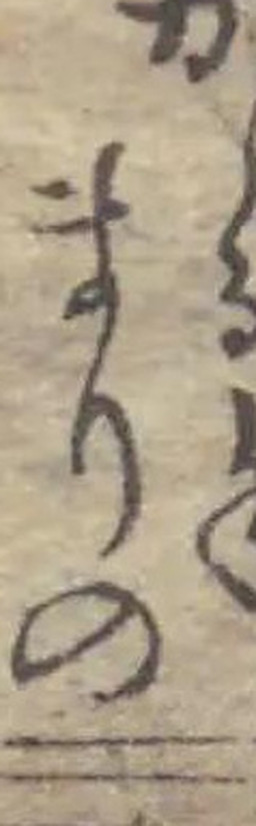まりの
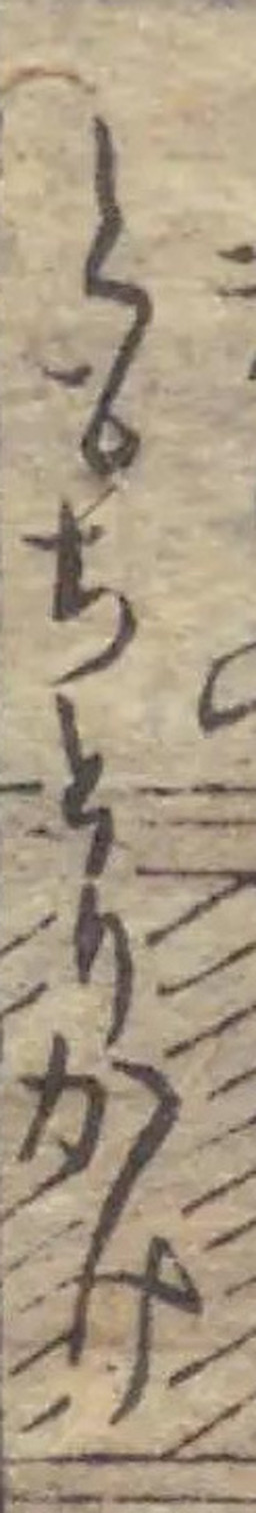ともちとりかけ

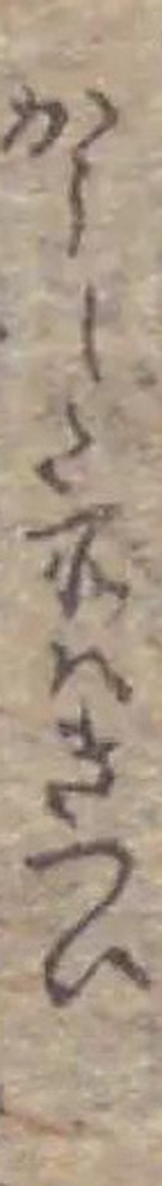かうした所はきつい
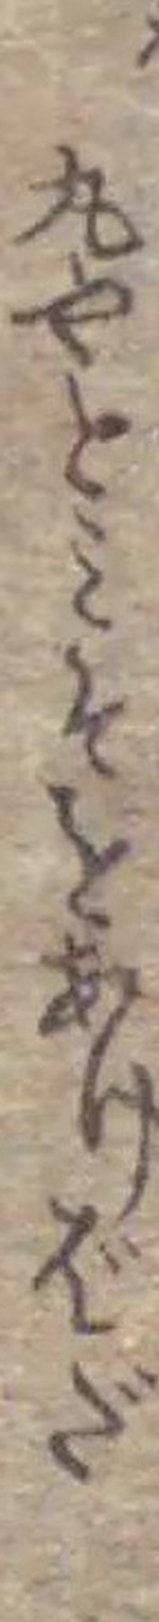丸やとみそをあけばだ
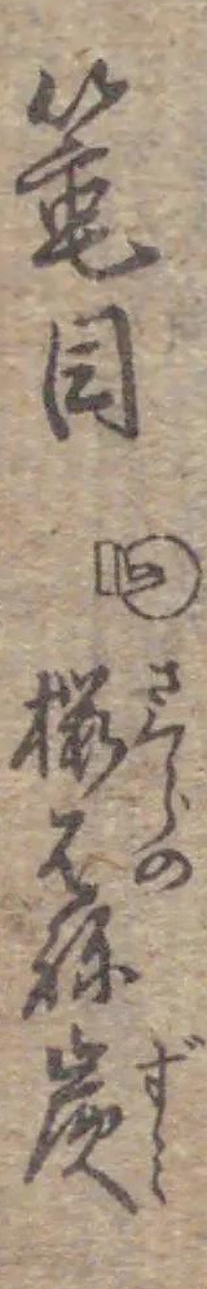篭目桜はね炭
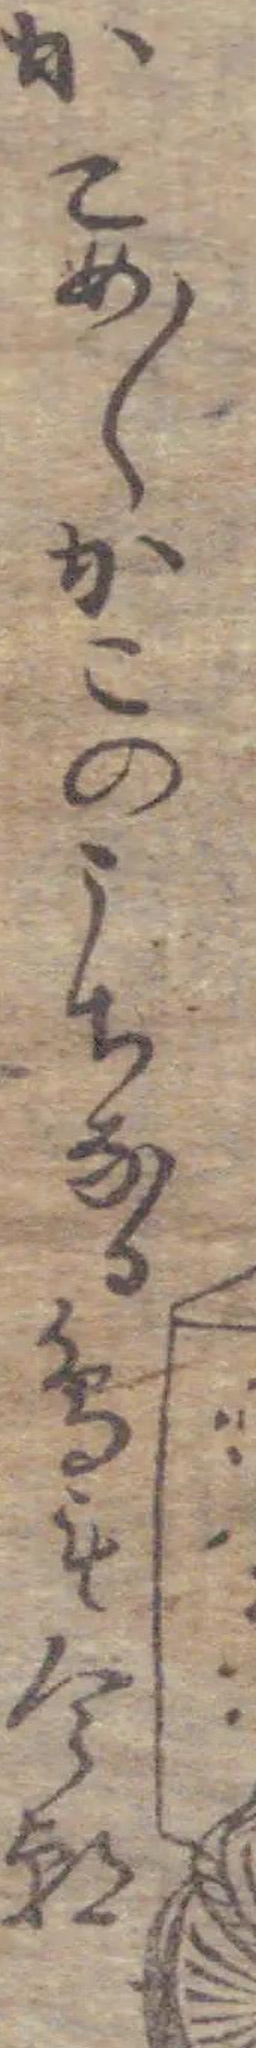かこめ〳〵かこのうちなる鳥斗今朝
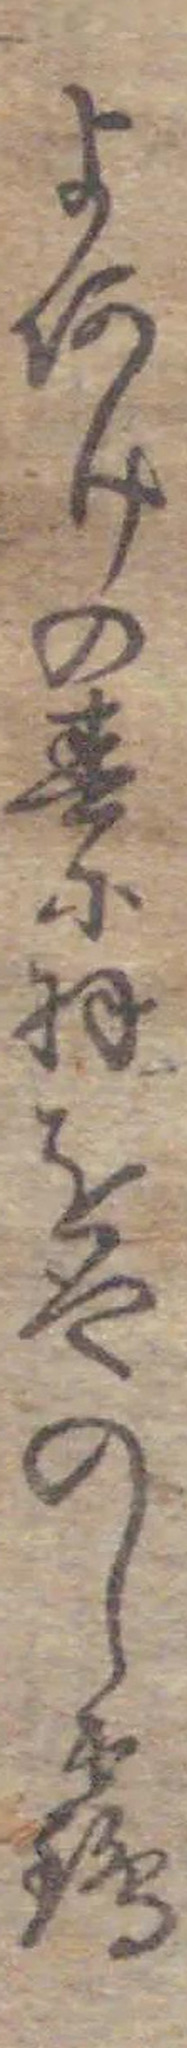よあけの春に羽をやのし鶴

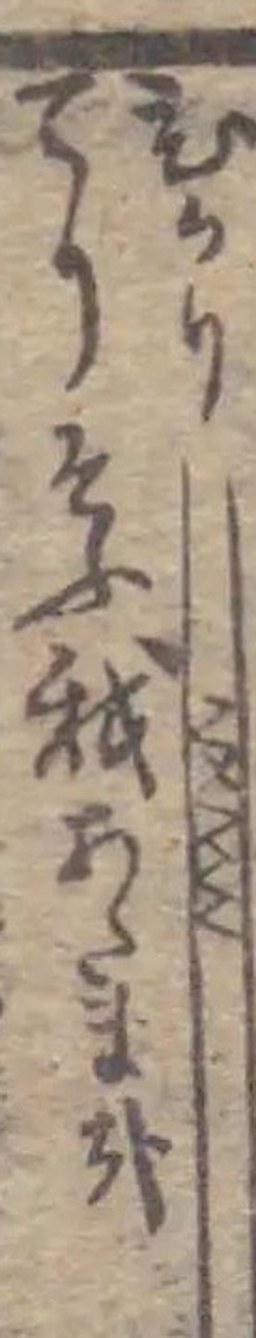てりそふ我あたま哉
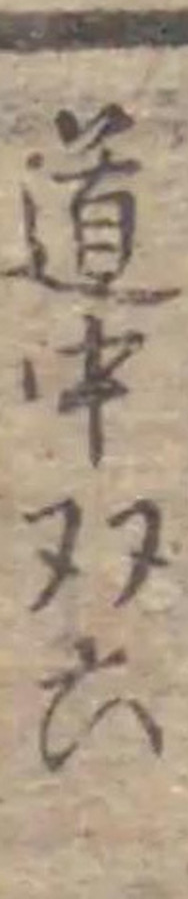道中双六
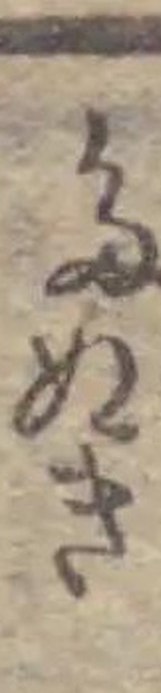たぬき
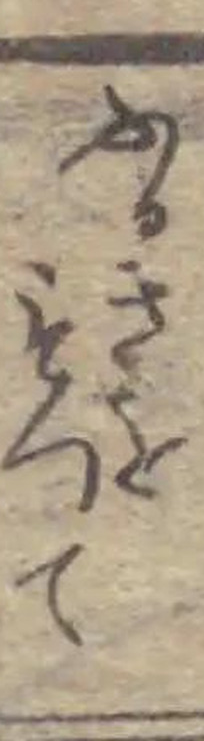ふるきを
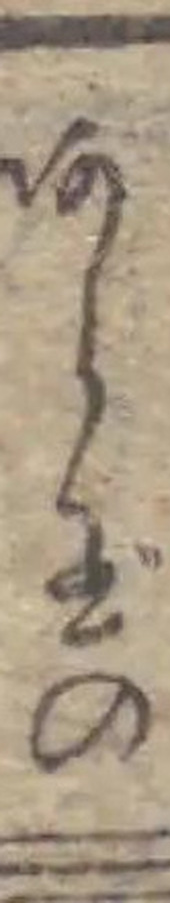あら玉の
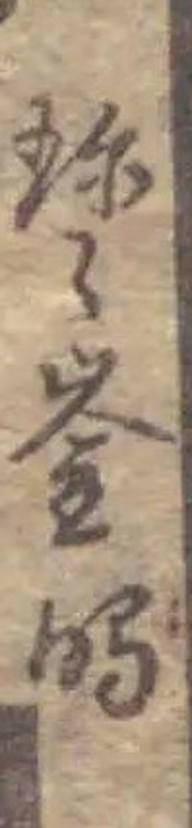珍々釜鳴
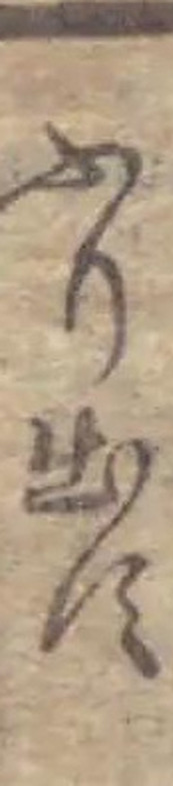ふり出す
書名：金平子供遊 2巻
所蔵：国立国会図書館 National Diet Library, JAPAN
